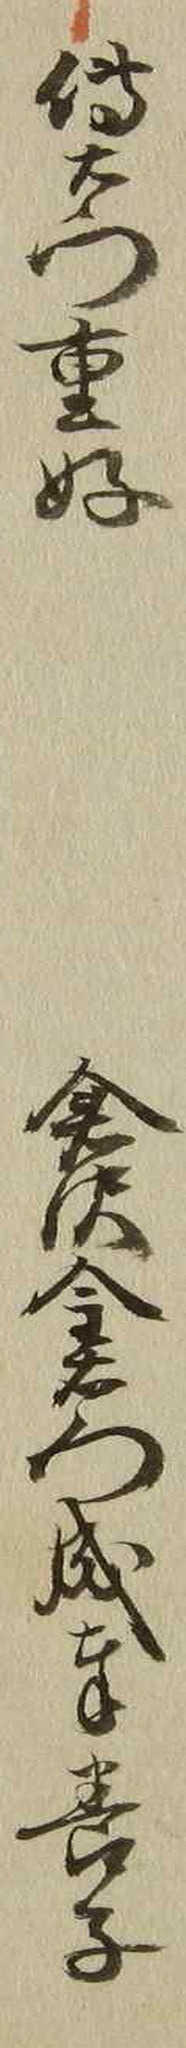伝右衛門重好倉沢金右ヱ門成奉養子
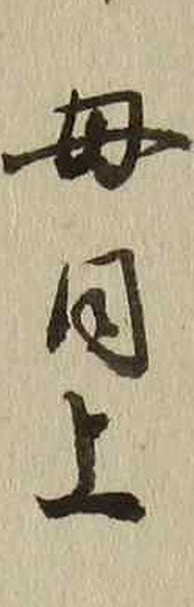母同上
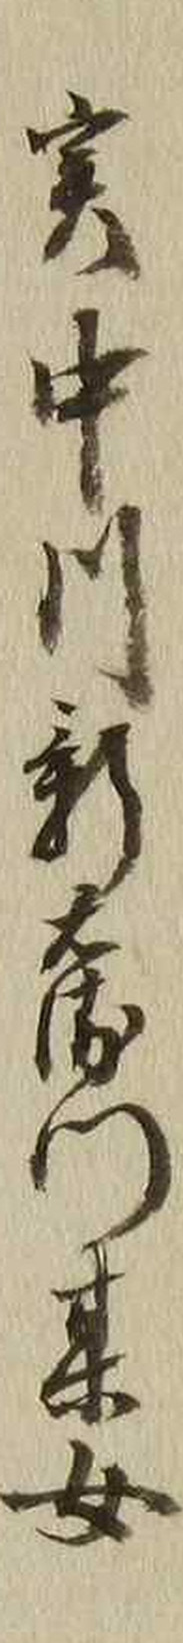実中川新右衛門某女
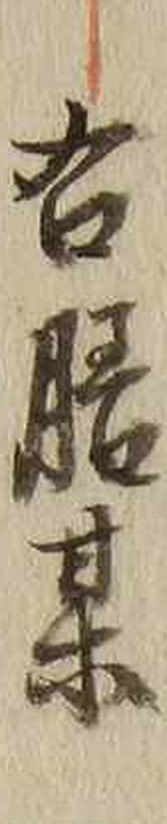右膳某
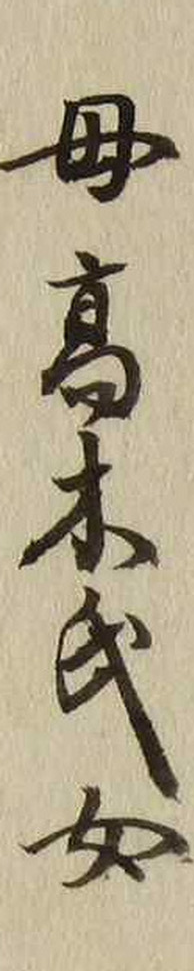母髙木氏女
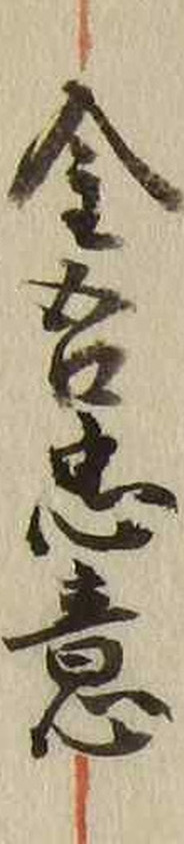金吾忠意
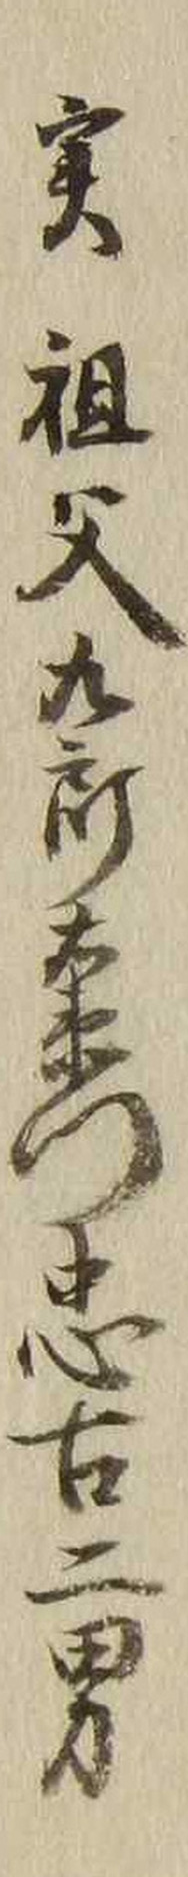実祖父九郎右衛門忠古二男

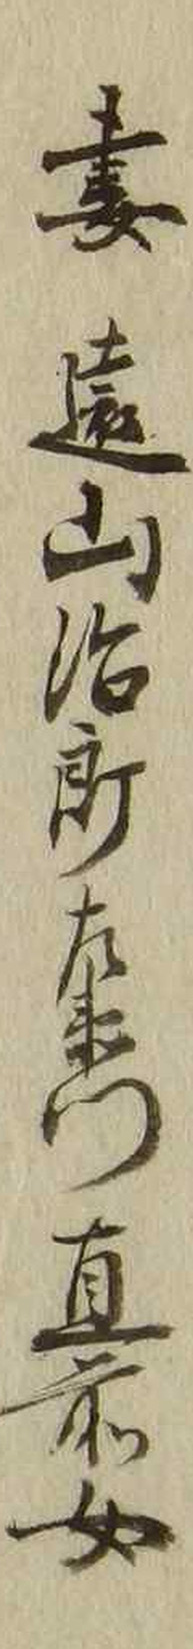妻遠山治郎左衛門直前女
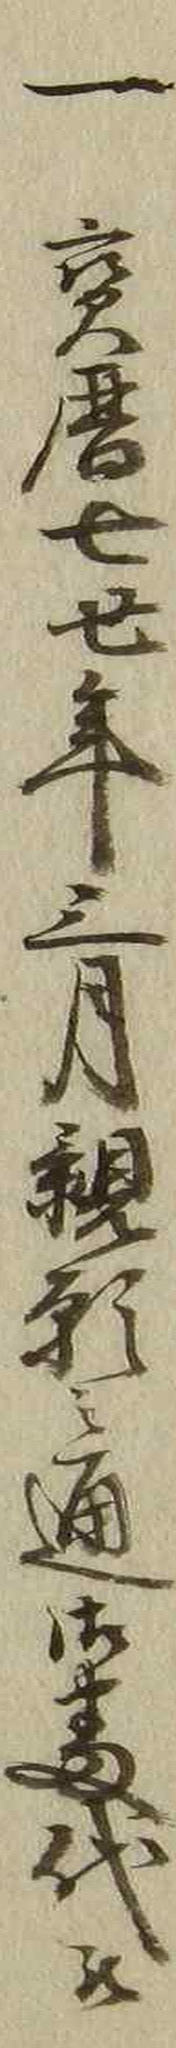一宝暦七丑年三月親願之通御番代被
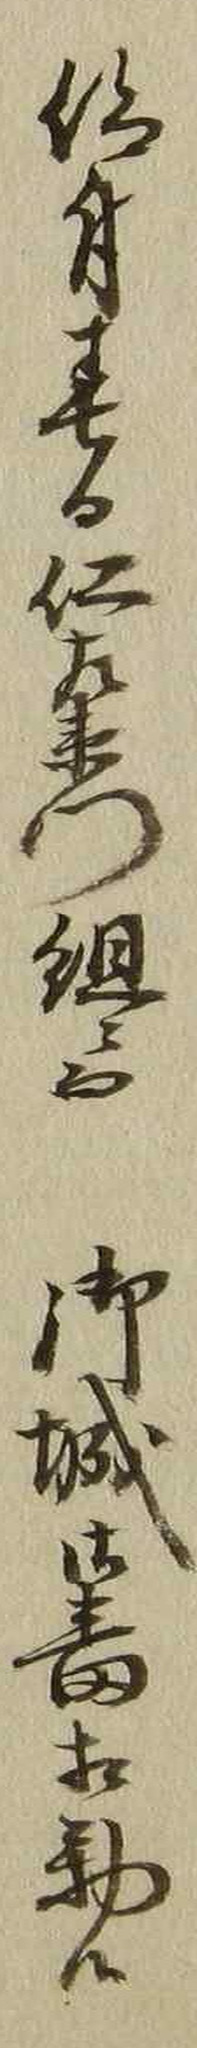仰付春日仁左衛門組ニ而御城御番相勤候
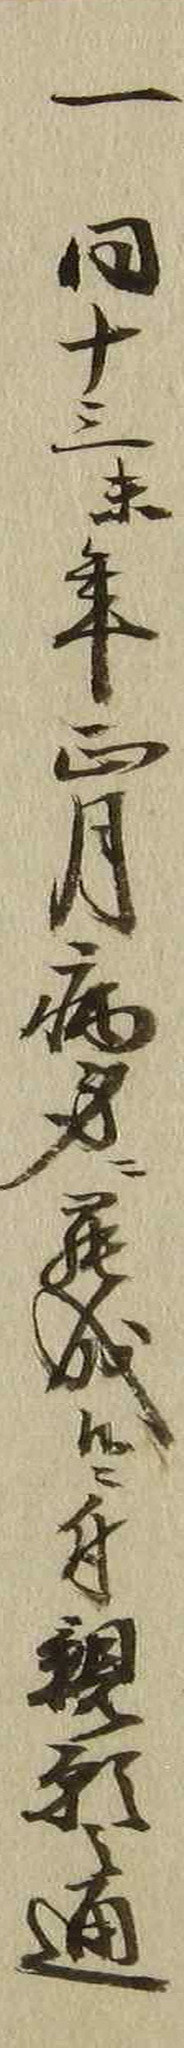一同十三未年正月病身ニ罷成候ニ付親願之通
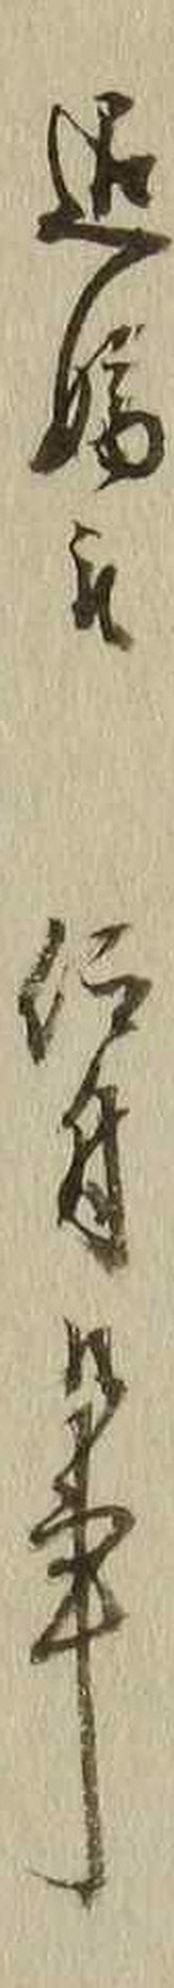退嫡被仰付候事
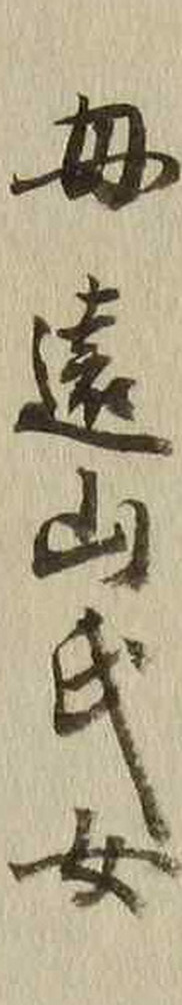母遠山氏女
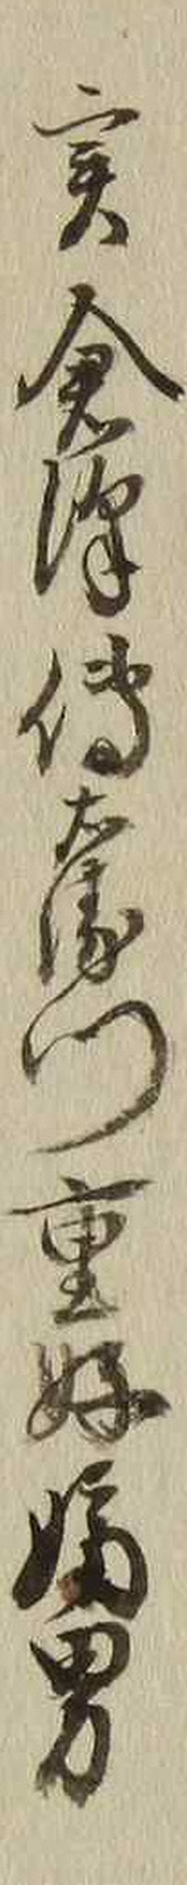実倉沢伝右衛門重好嫡男
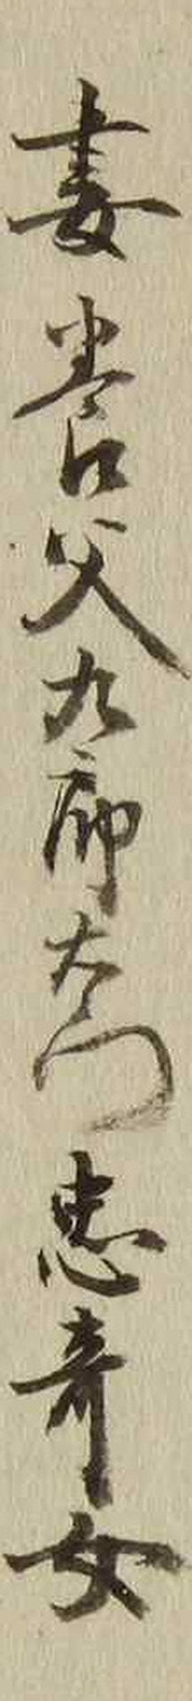妻養父九郎右衛門忠奇女
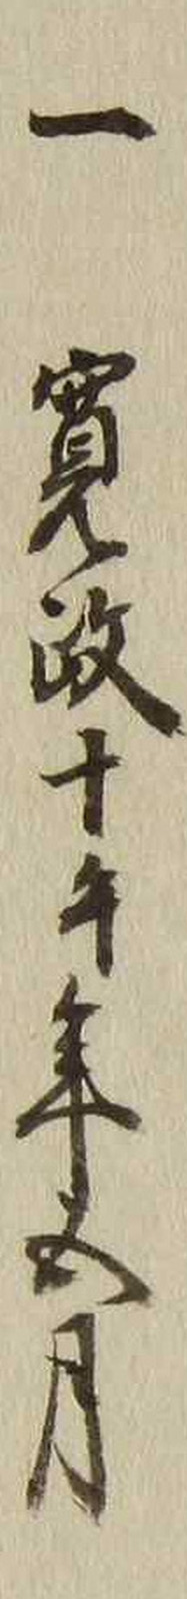一寛政十午年五
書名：諸士系譜　巻之64　と之部7
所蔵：会津若松市立会津図書館
